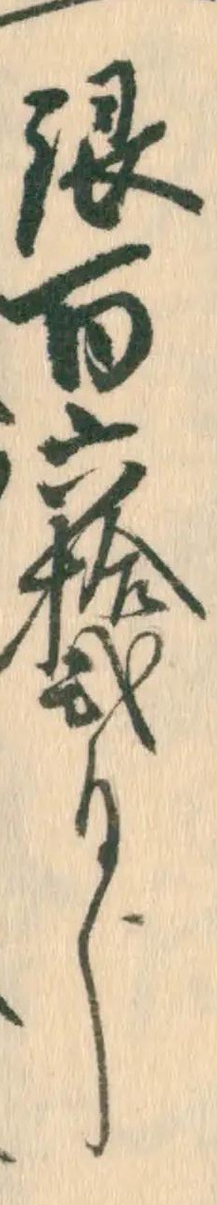〆銀百六拾弐匁
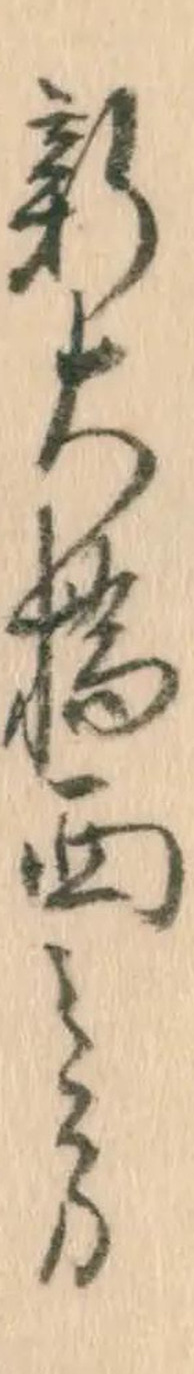新大橋西之方
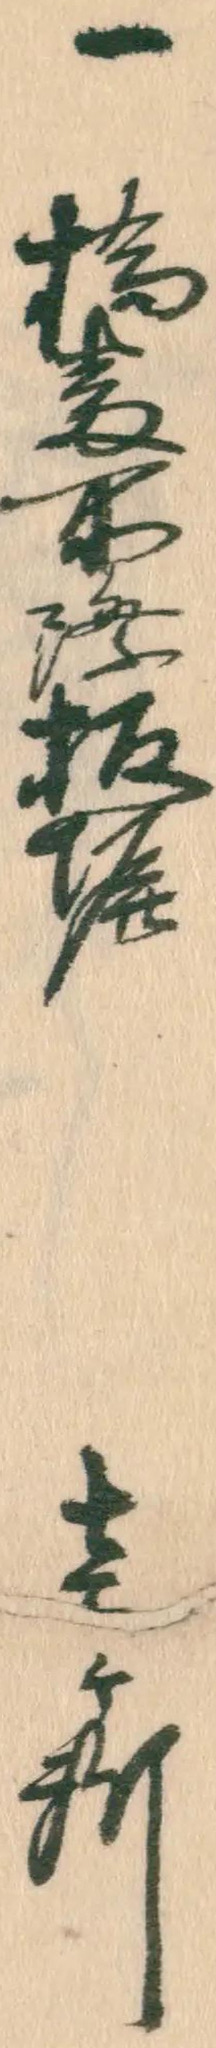一橋番所際板塀壱ケ所
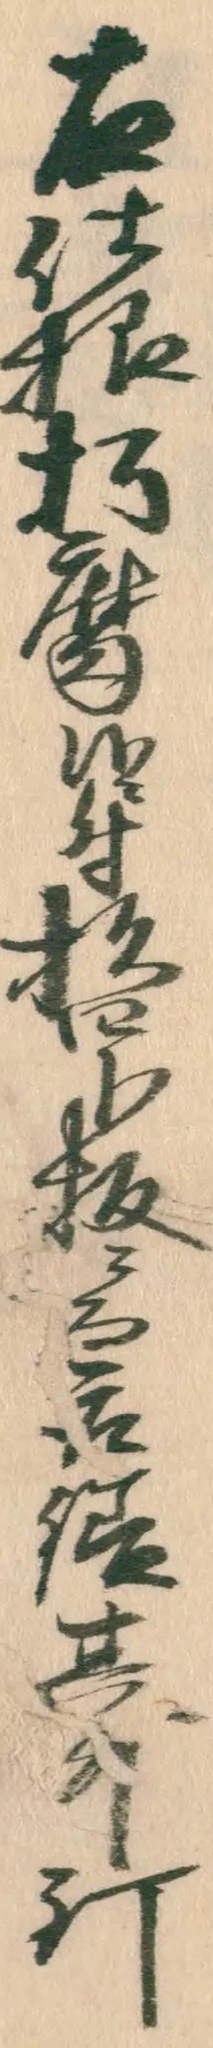右仕様朽腐候ニ付杉四分板ニ而取繕其外釘
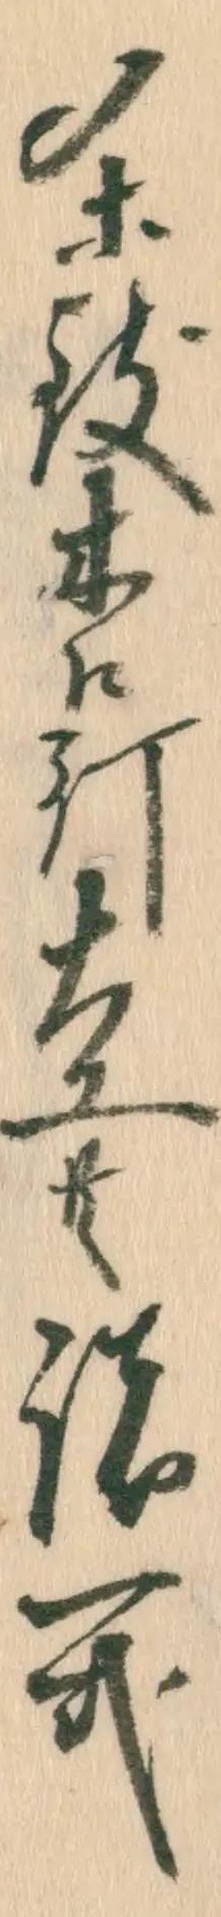〆等致木口釘大工共諸一式
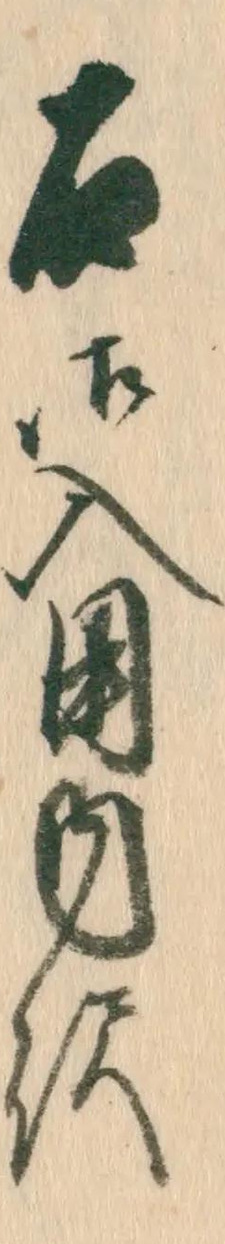右御入用内訳
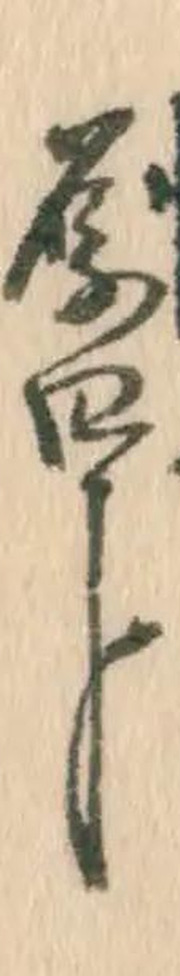厚四分
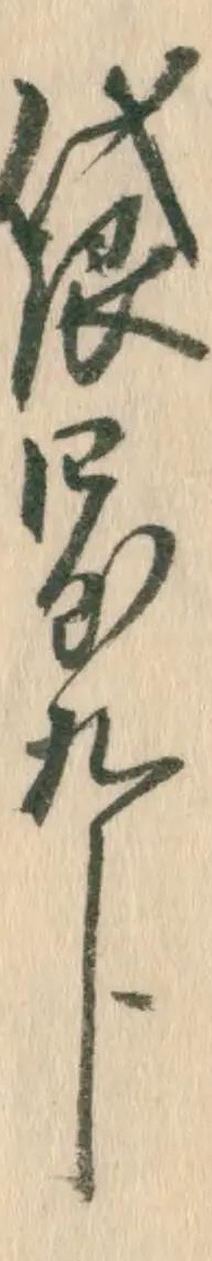代銀三匁五分
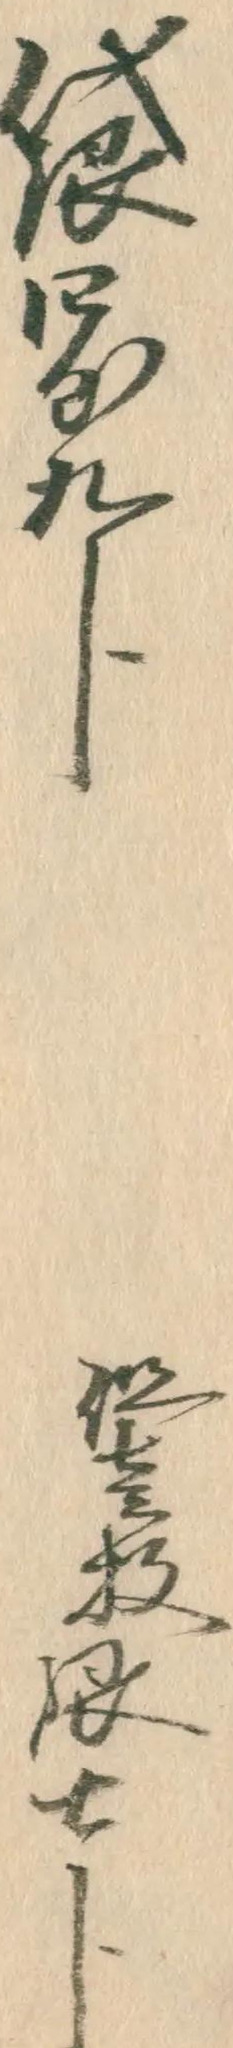代銀四匁九分但壱枚銀七分
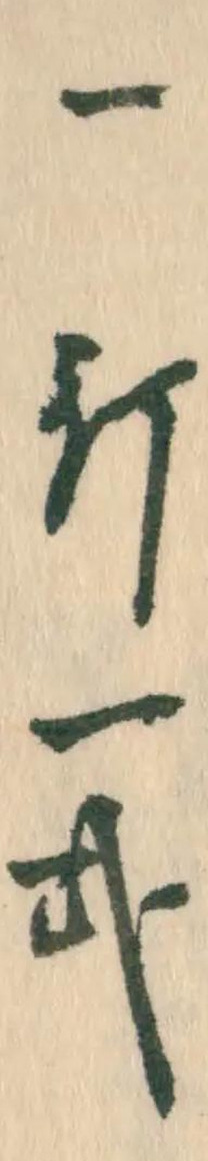一釘一式

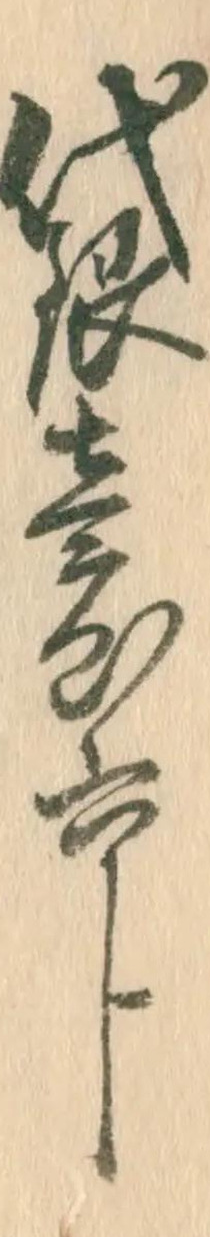代銀壱匁六分
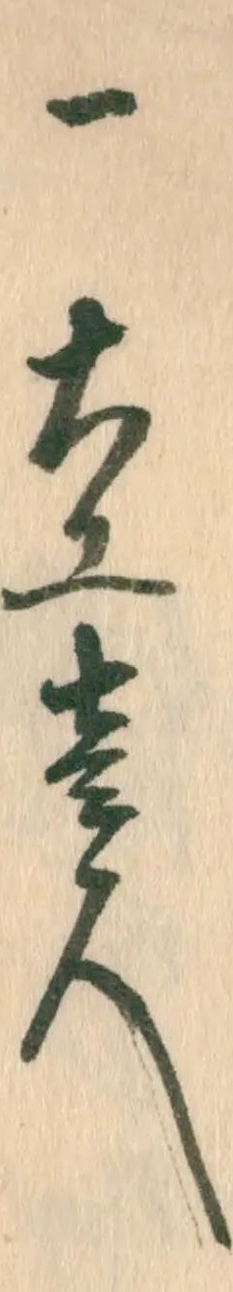一大工壱人
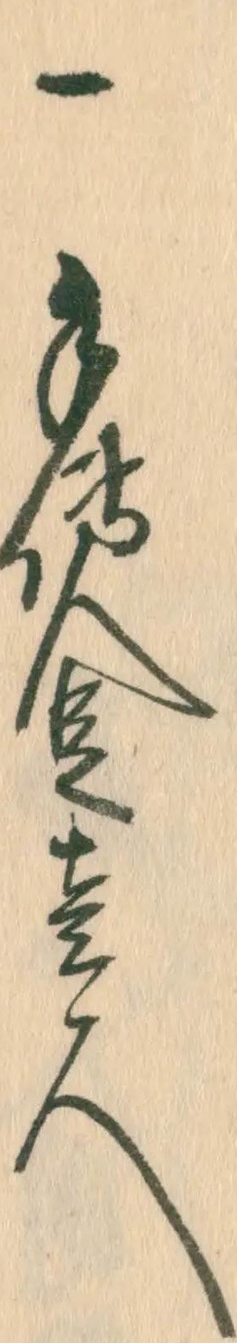一手伝人足壱人
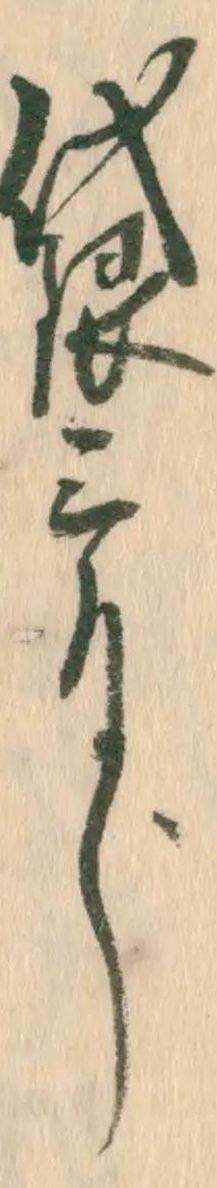代銀三匁
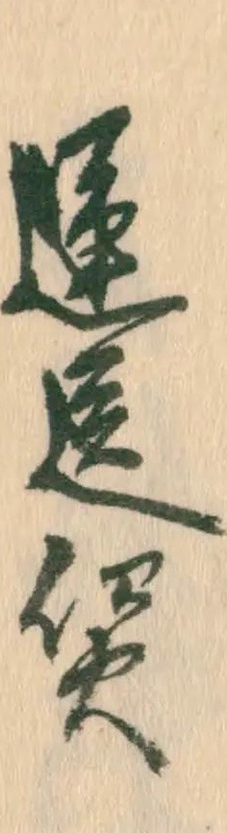一運送賃
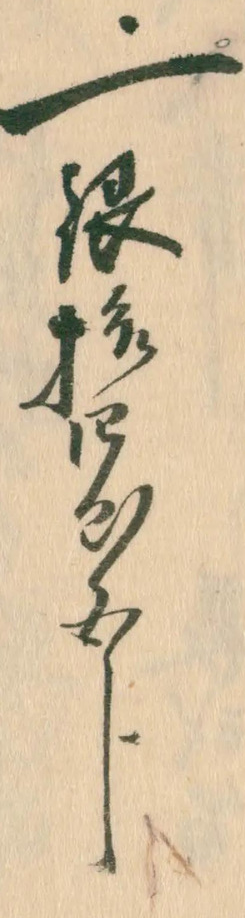〆銀拾四匁五分
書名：三橋 17巻. [8] 三橋小破御修復書留　但御奉行御掛リ替地震潰橋番屋　嘉永四亥年より安政二卯年迄　下
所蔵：国立国会図書館 National Diet Library, JAPAN
